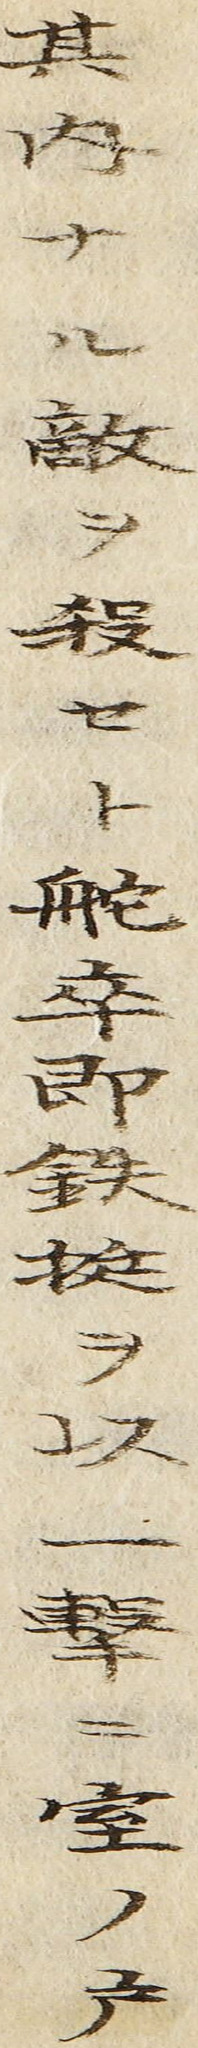其内ナル敵ヲ殺セト舵卒即鉄梃ヲ以一撃ニ室ノ戸
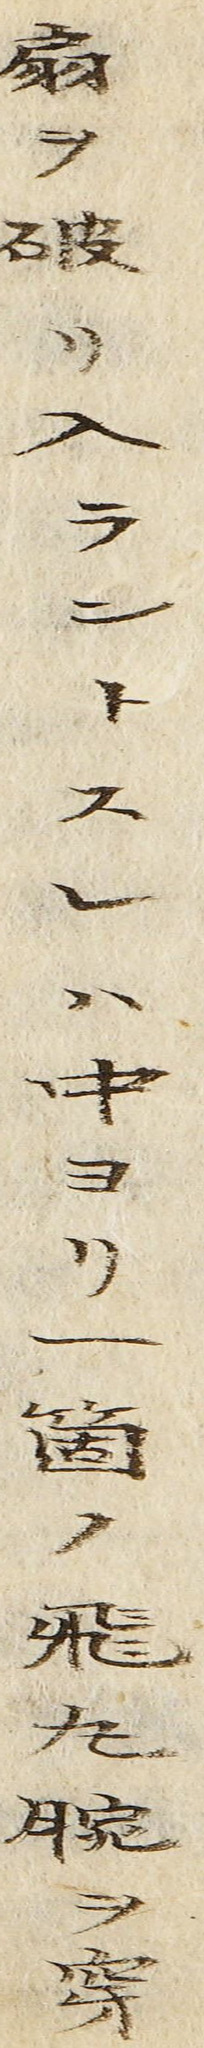扇ヲ破リ入ラントスレハ中ヨリ一箇ノ飛丸腕ヲ穿
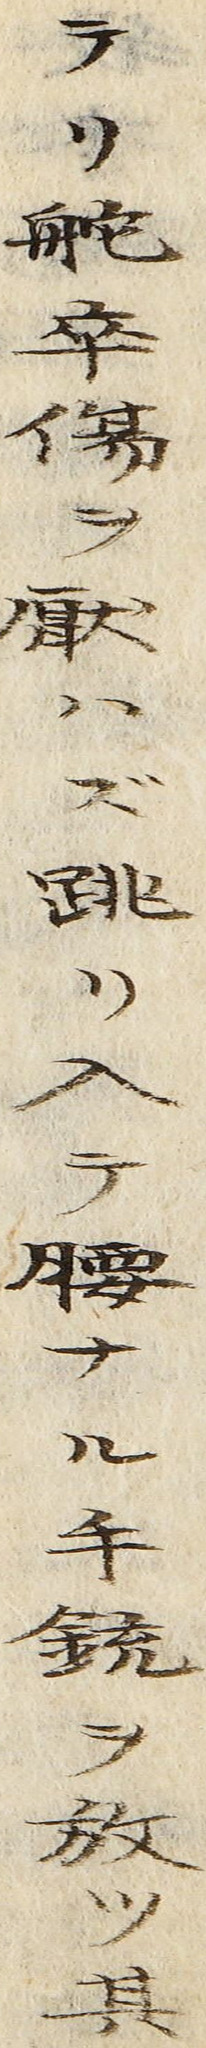テリ舵卒傷ヲ厭ハズ跳リ入テ腰ナル手銃ヲ放ツ其
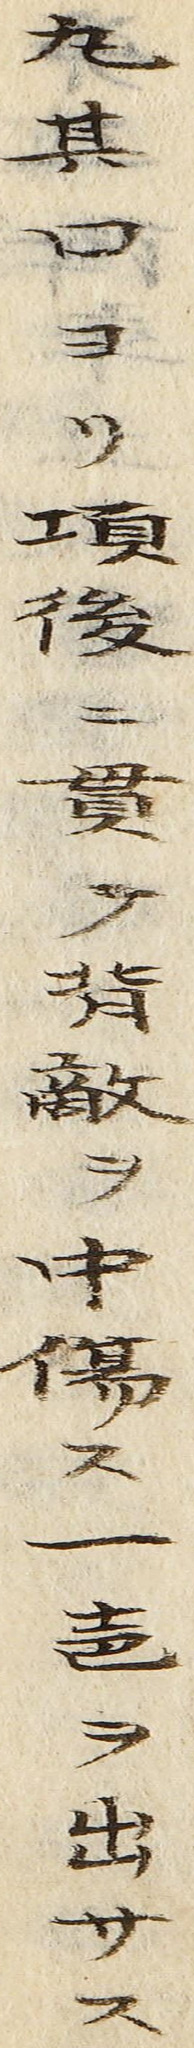丸其口ヨリ項後ニ貫テ背敵ヲ中傷ス一声ヲ出サス
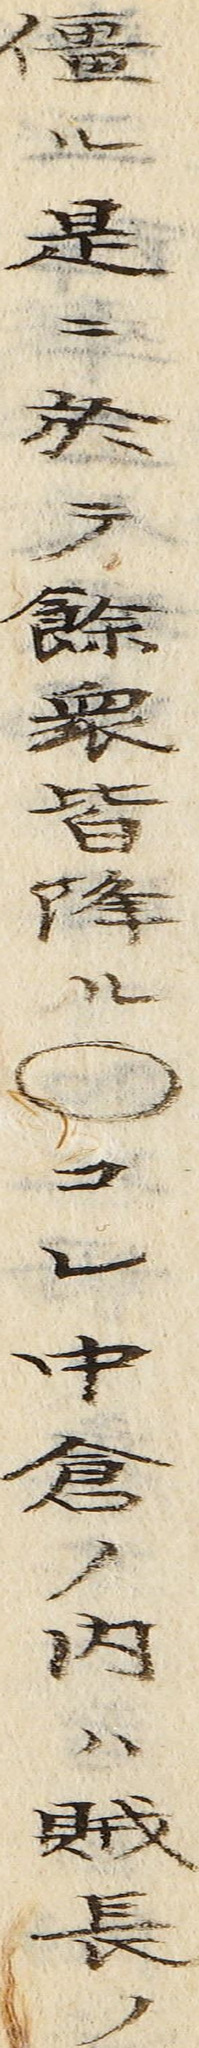僵ル是ニ於テ余衆皆降ル◯コレ中倉ノ内ハ賊長ノ
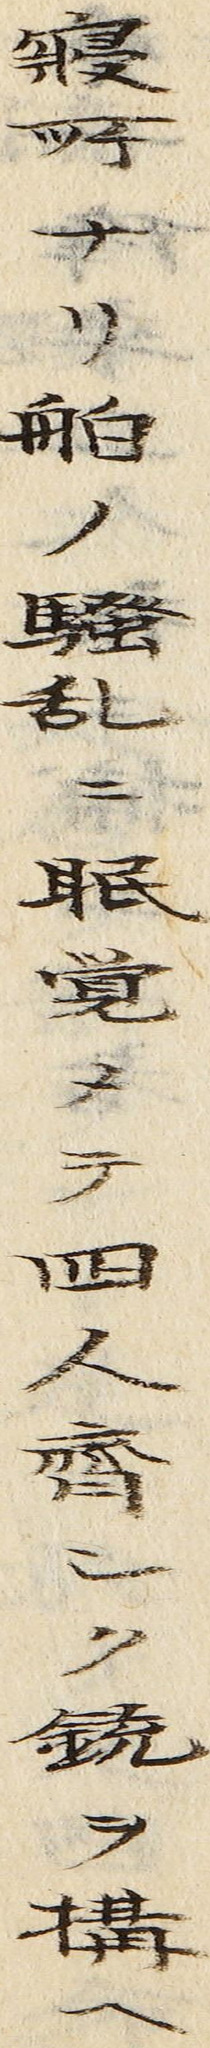寝所ナリ舶ノ騒乱ニ眠覚メテ四人斉シク銃ヲ搆ヘ
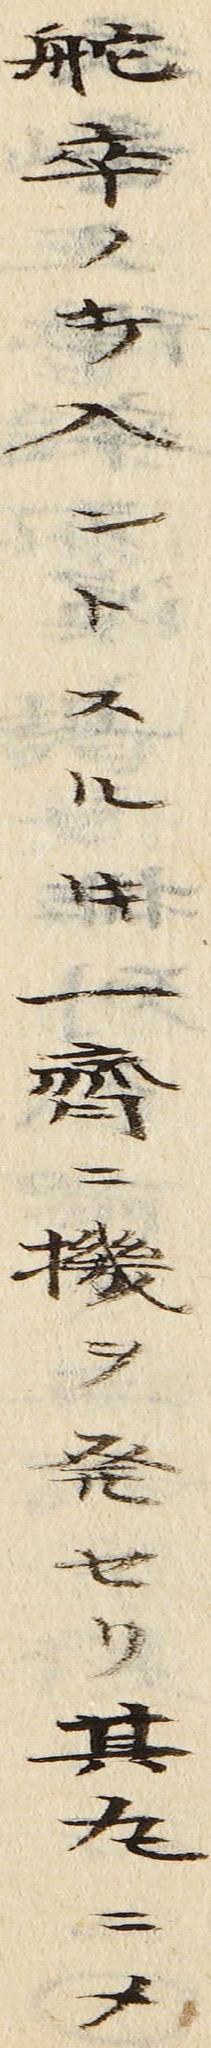舵卒ノ打入ントスルトキ一斉ニ機ヲ発セリ其丸ニシテ
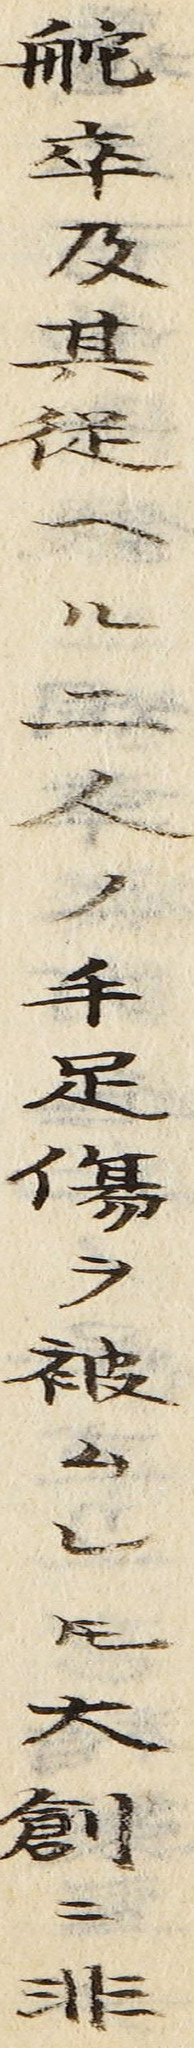舵卒及其従ヘル二人ノ手足傷ヲ被ムレトモ大創ニ非
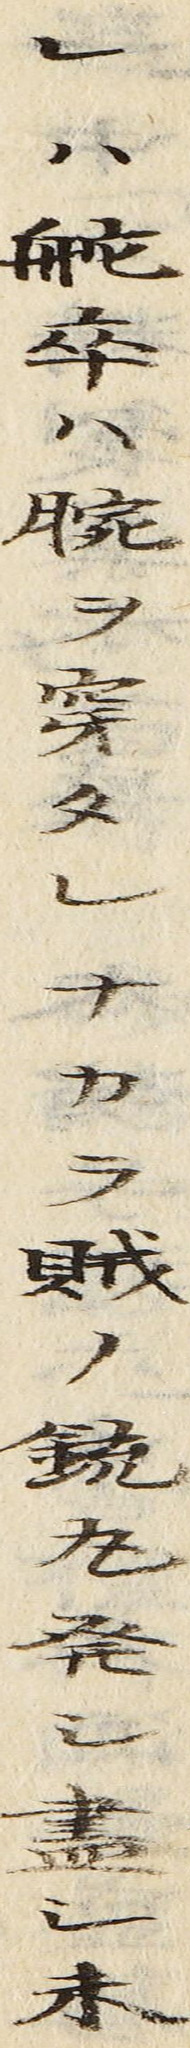レハ舵卒ハ腕ヲ穿タレナカラ賊ノ銃丸発シ尽シ未
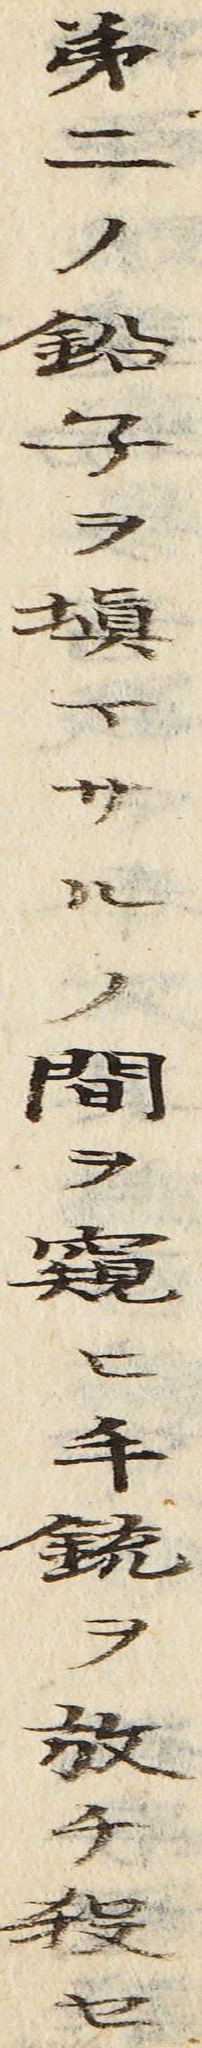第二ノ鉛子ヲ填マサルノ間ヲ窺ヒ手銃ヲ放チ殺セ
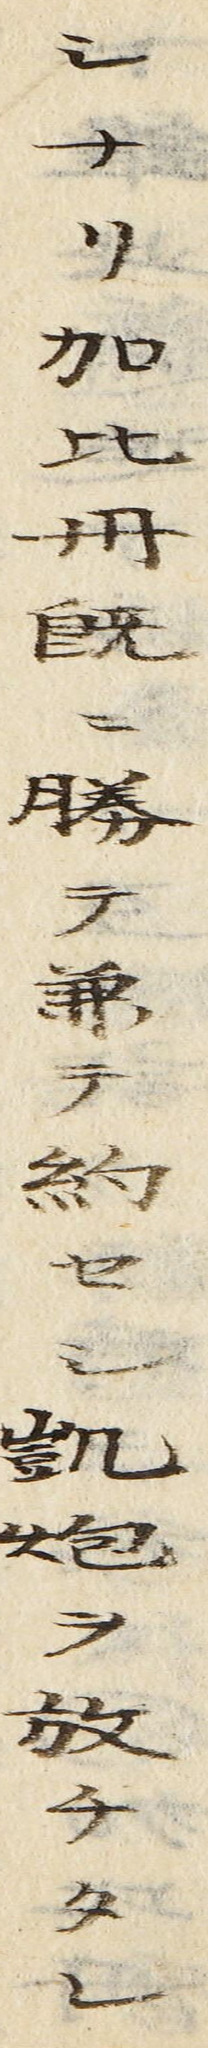シナリ加比丹既ニ勝テ兼テ約セシ凱炮ヲ放チタレ
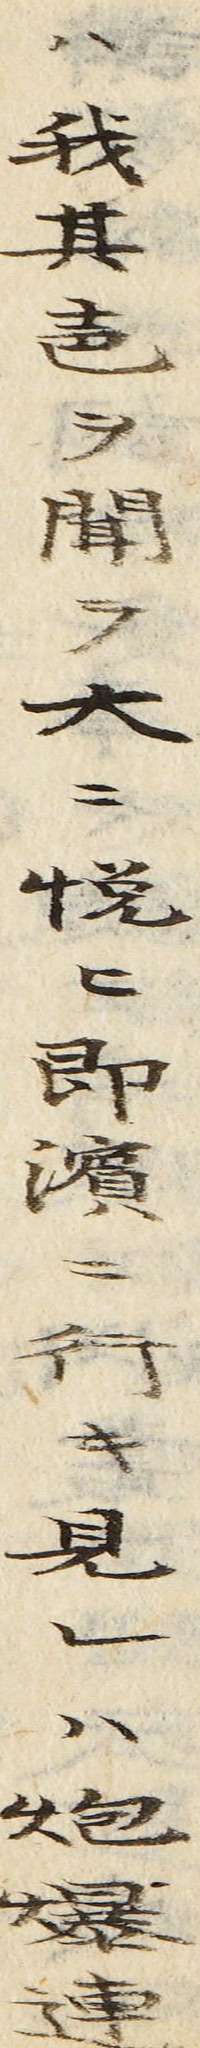ハ我其声ヲ聞テ大ニ悦ヒ即浜ニ行キ見レハ炮爆連
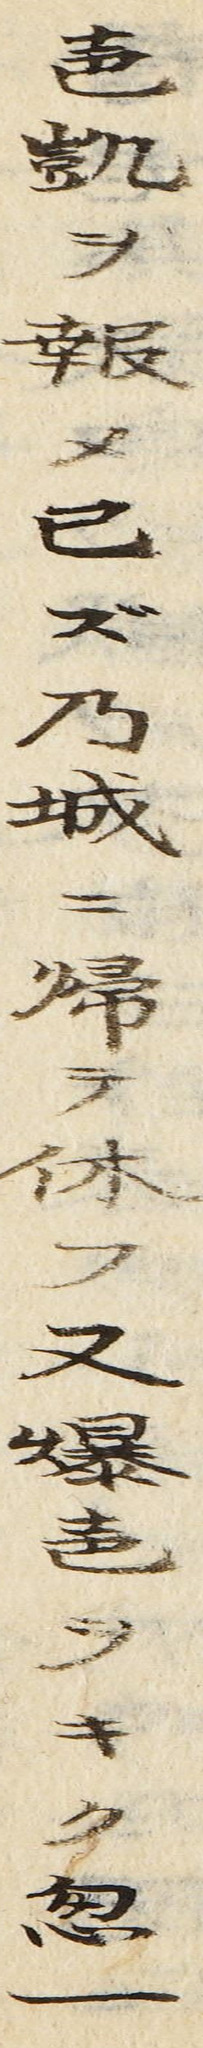声凱ヲ報シテ已ズ乃城ニ帰テ休フ又爆声ヲキク忽一
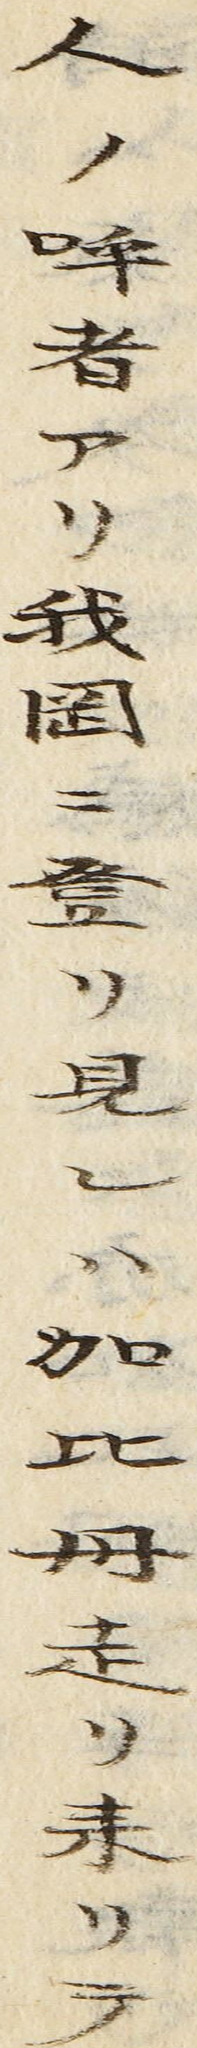人ノ呼者アリ我岡ニ登リ見レハ加比丹走リ来リテ
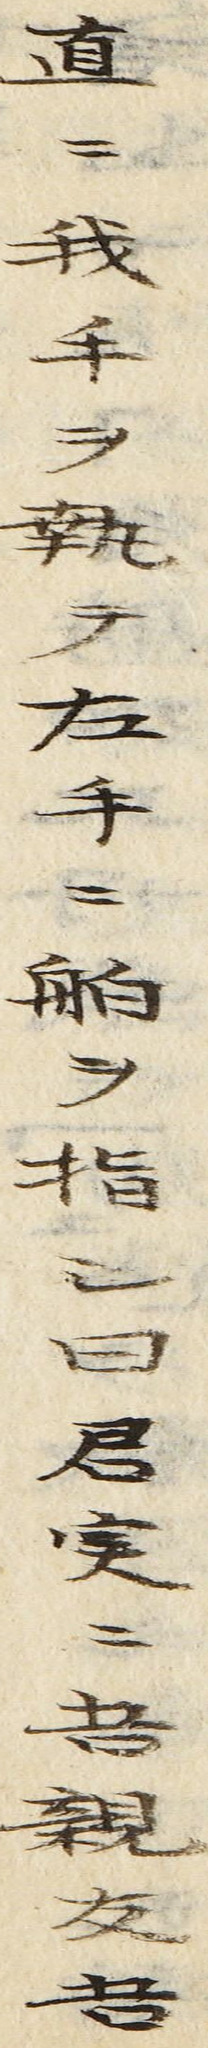直ニ我手ヲ執テ左手ニ舶ヲ指シ曰君実ニ吾親友吾
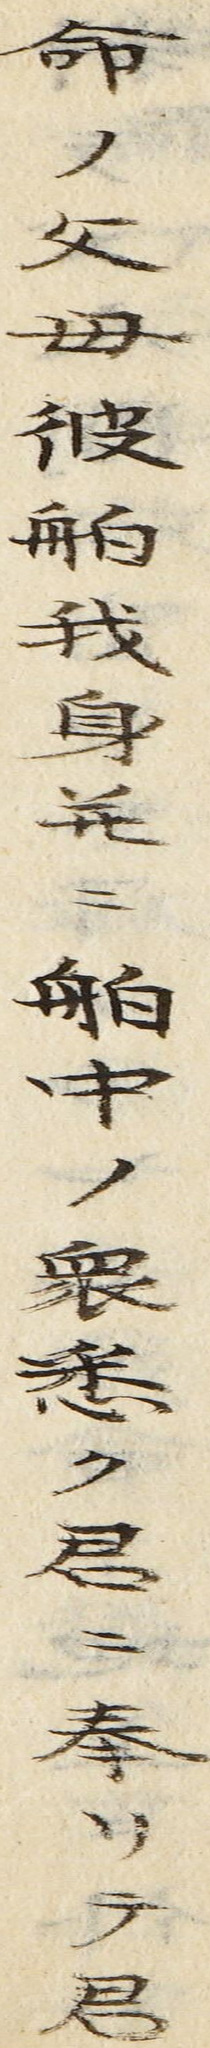命ノ父母彼舶我身并ニ舶中ノ衆悉ク君ニ奉リテ君
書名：漂流紀事
